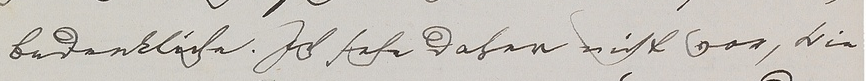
bedenkliche. Ich sehe daher nicht vor, wie
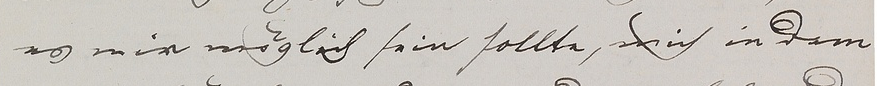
es mir möglich sein sollte, mich in dem
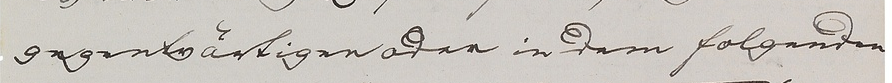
gegenwärtigen oder in dem folgenden
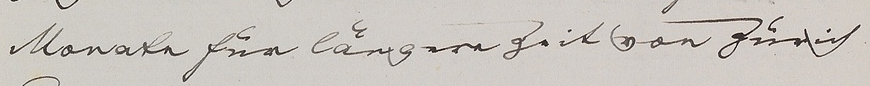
Monate für längere Zeit von Zürich
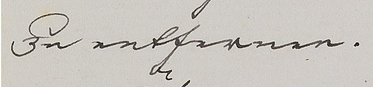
zu entfernen.
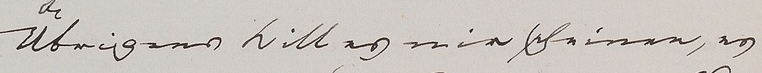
Übrigens will es mir scheinen, es
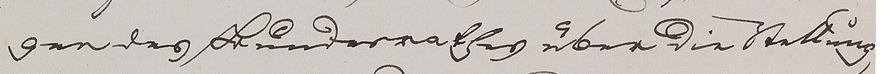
gen des Bundesrathes über die Stellung,
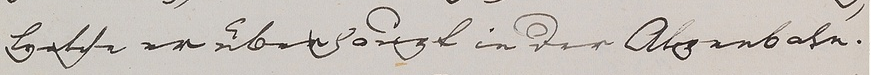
welche er überhaupt in der Alpenbahn-
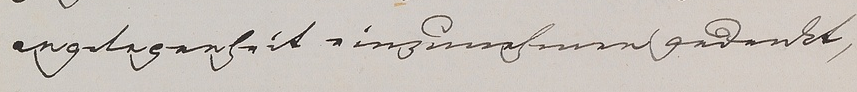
angelegenheit einzunehmen gedenkt,
